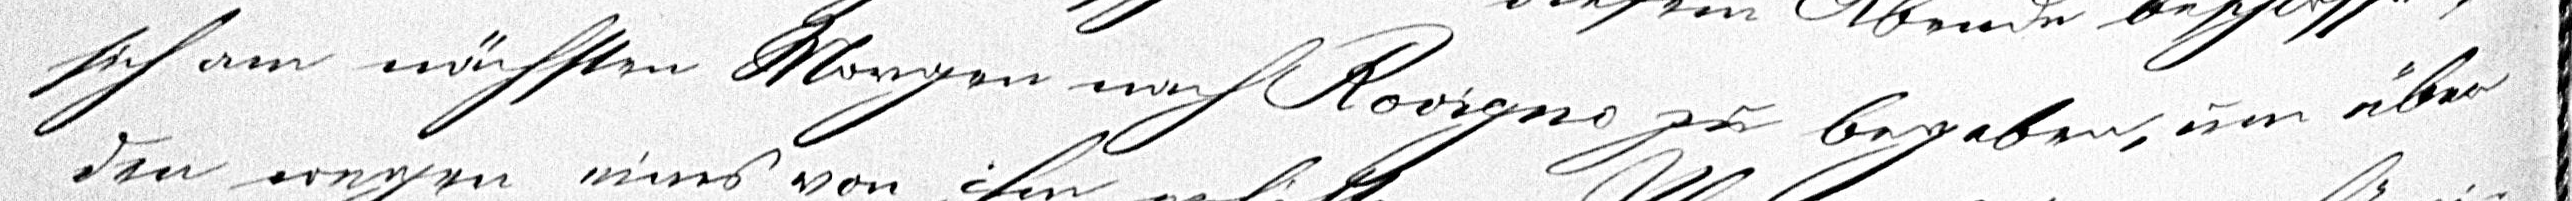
sich am nächsten Morgen nach Rovigno zu begeben, um über
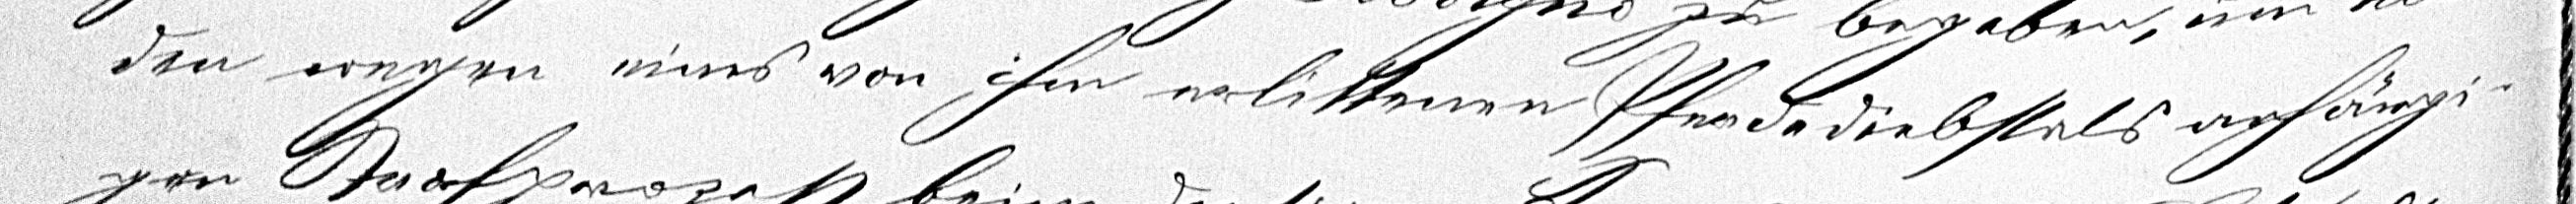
den wegen eines von ihm erlittenen Pferde Diebstals anhängi¬
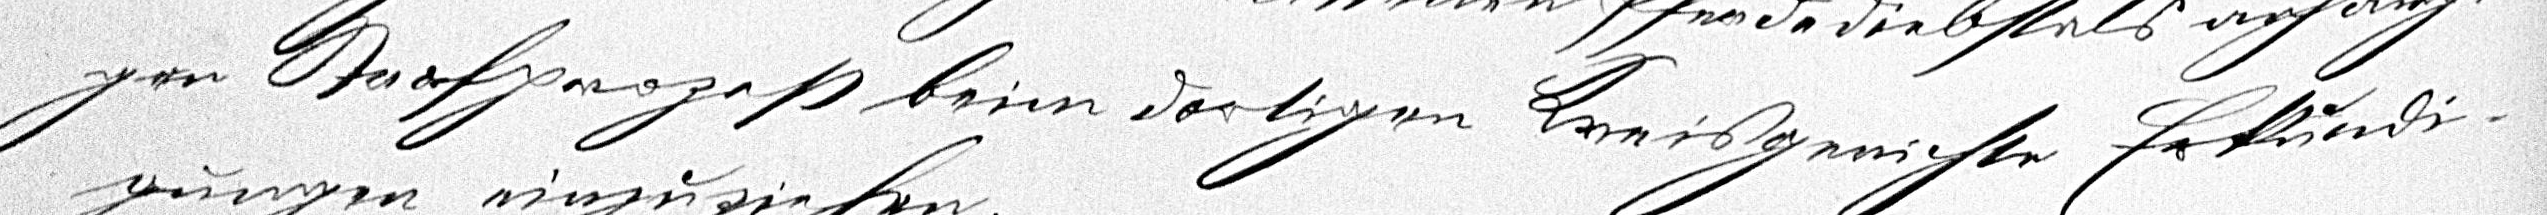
gen Strafprozeß beim dortigen Kreisgerichte Erkundi¬
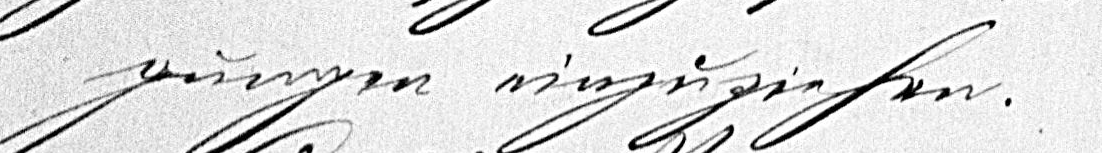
gungen einzuziehen.
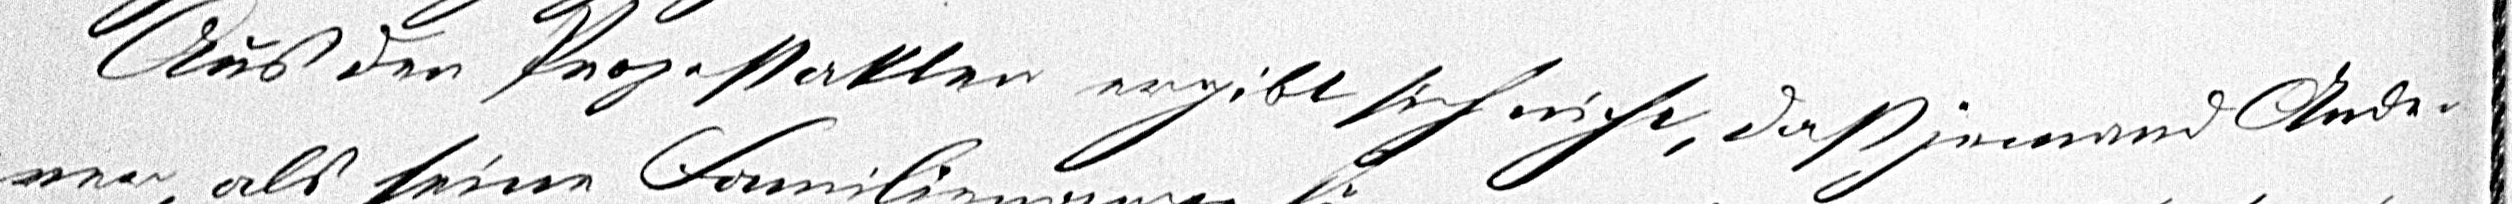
Aus den Prozeßakten ergibt sich nicht, daß jemand Ande¬
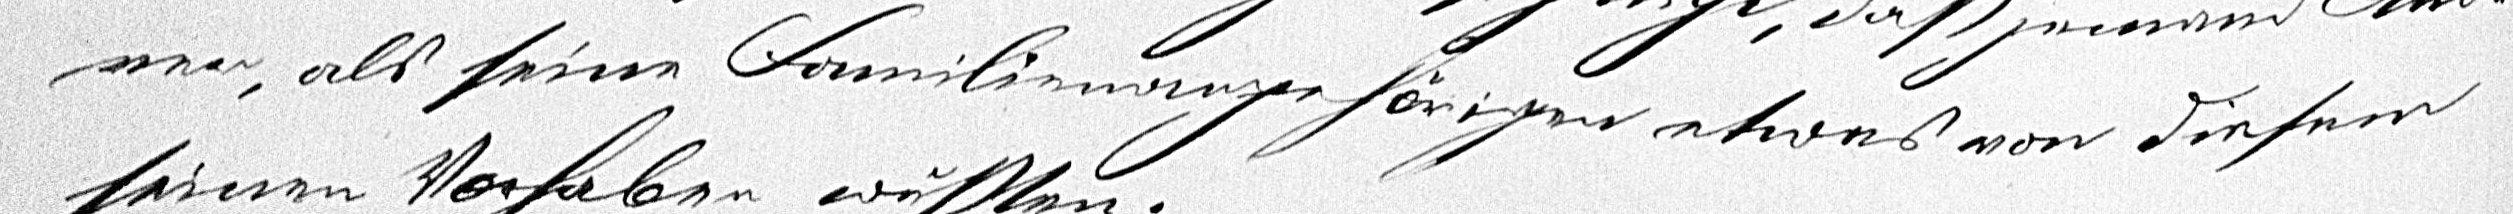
rer, als seine Familienangehörigen etwas von diesem
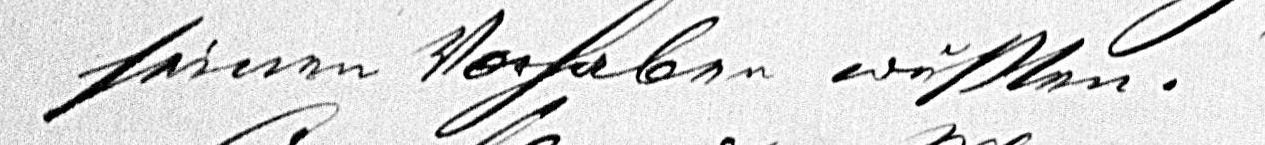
seinen Vorhaben wußten.
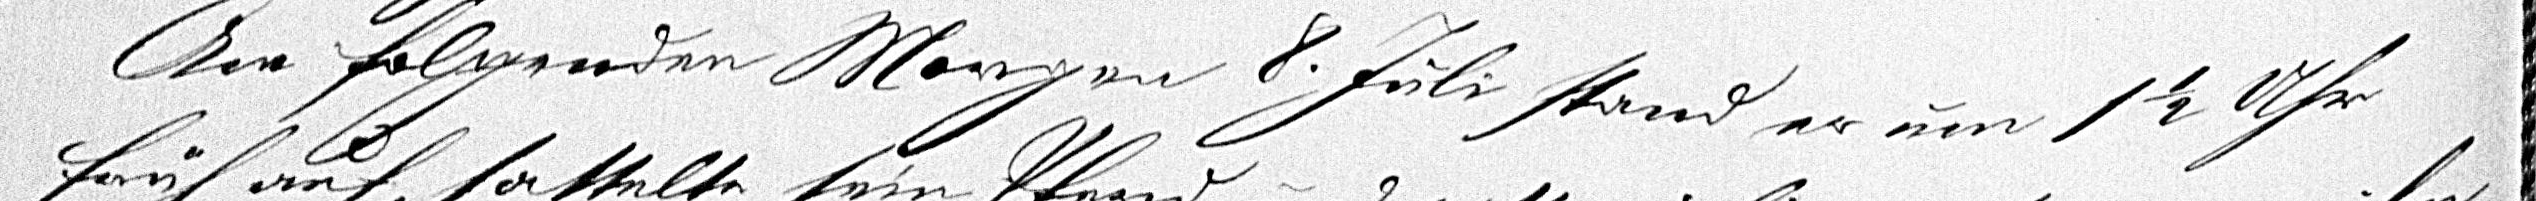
Am folgenden Morgen 8. Juli stand er um 1½ Uhr
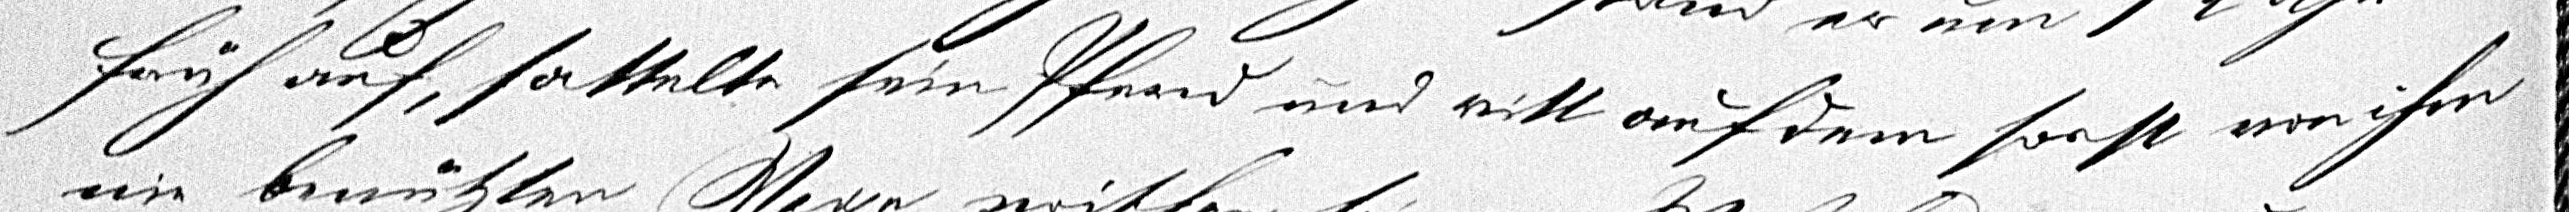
früh auf, sattelte sein Pferd und ritt auf dem sonst von ihm
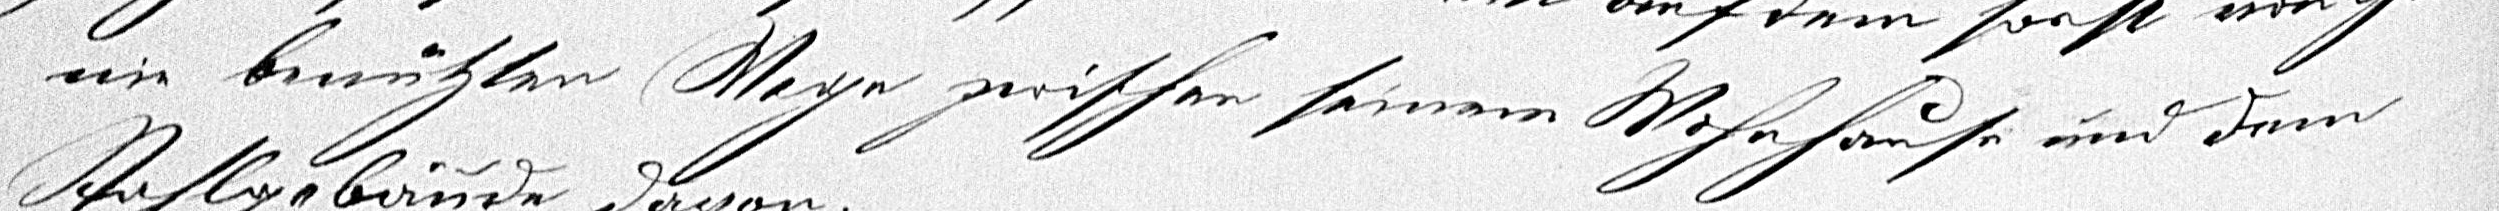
ein benähten Wege zwischen seinem Wohnhause und dem
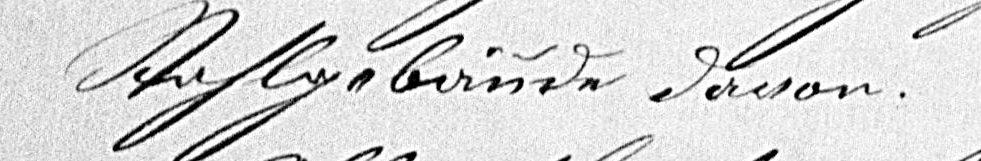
Stahlgebäude davon.
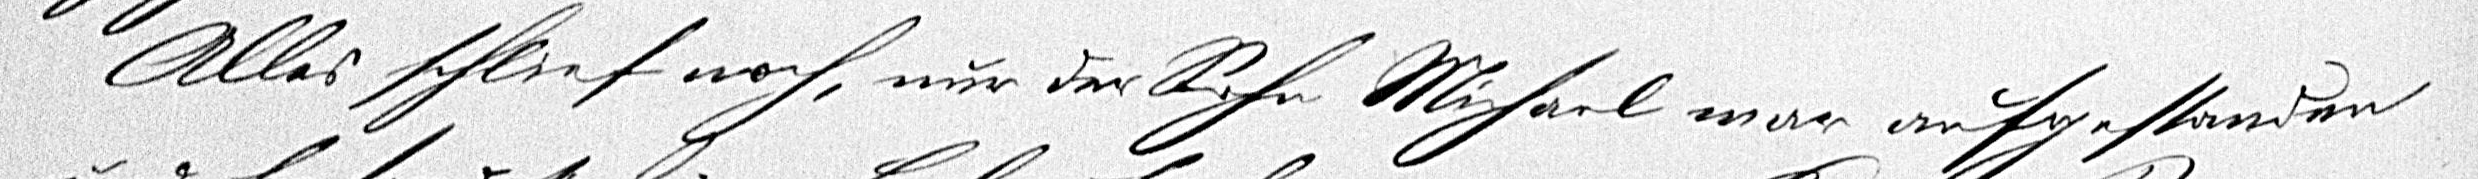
Alles schlief noch, nur der Sohn Michael war aufgestanden
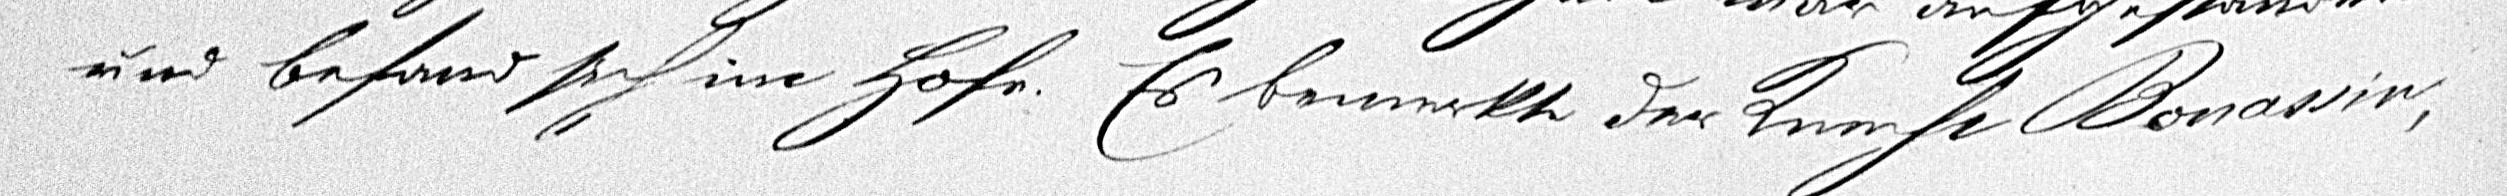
und befand sich im Hofe. Es bemerkte der Knecht Bonassin,
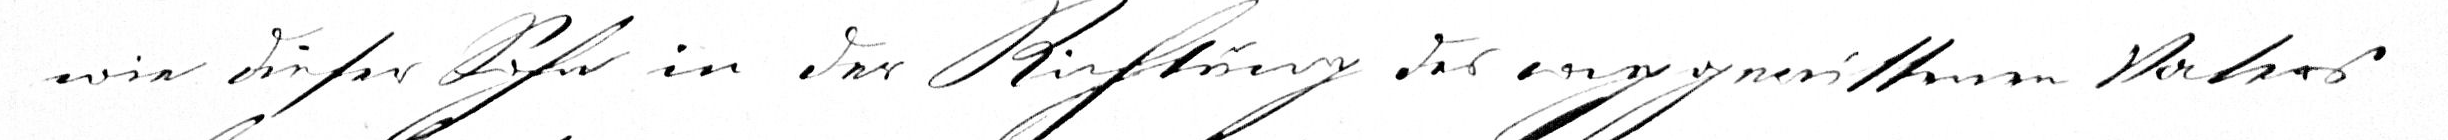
wie dieser Sohn in der Richtung des weggerissenen Vaters
